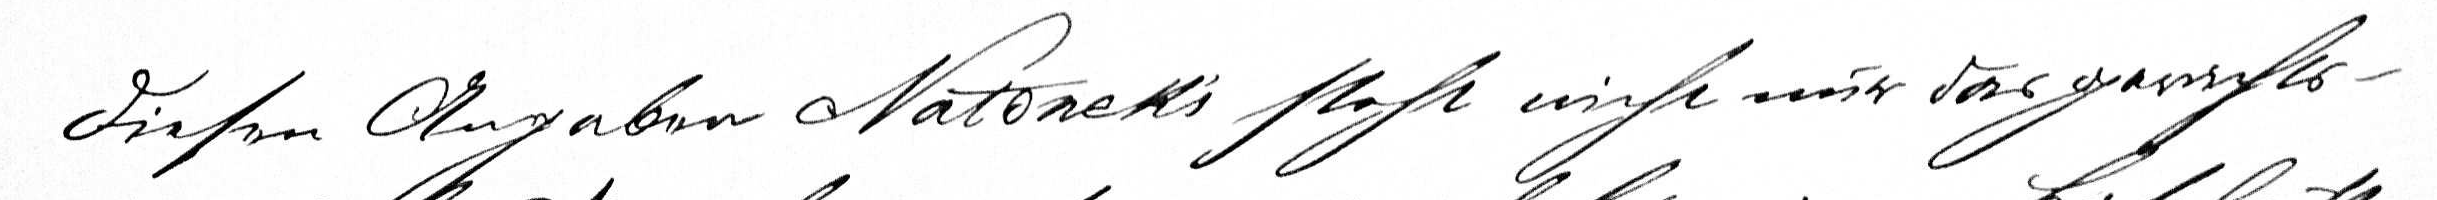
Diesen Angaben Natonecks steht nicht nur das gerichts¬
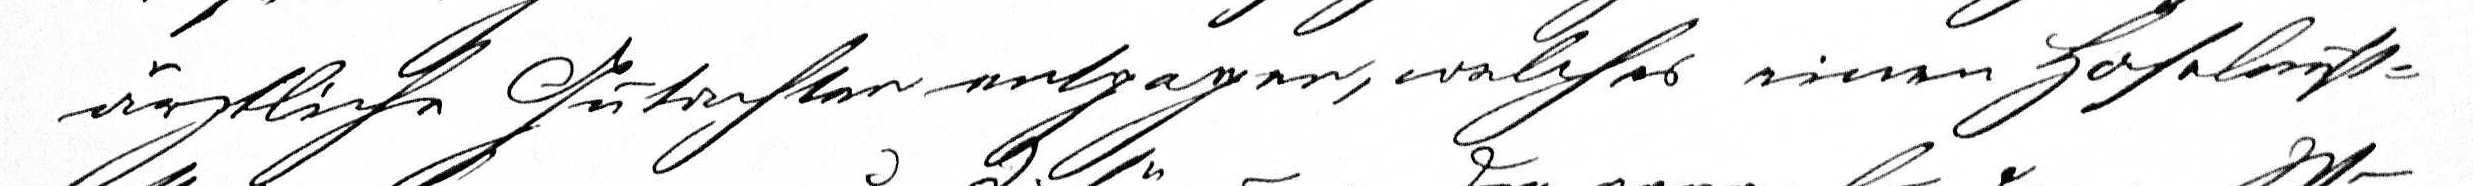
ärztliche Gutachten entgegen, welches einen Haselnußs¬
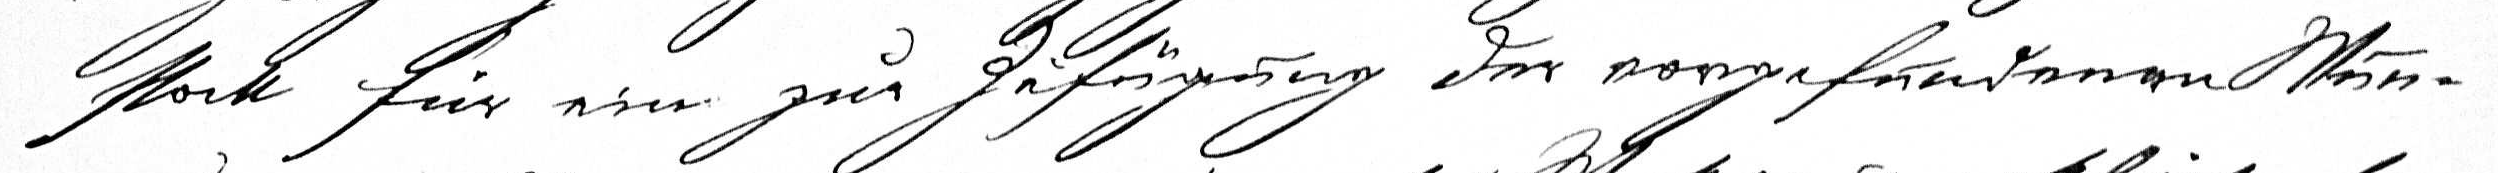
tock für ein zur Zufügung der vorgefundenen Wun¬
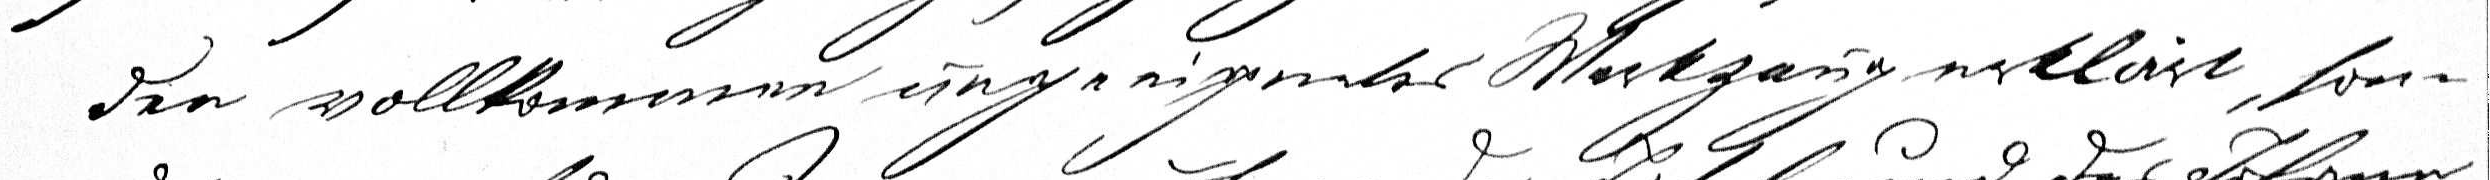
den vollkommen ungeeignetes Werkzeug erklärt, son¬
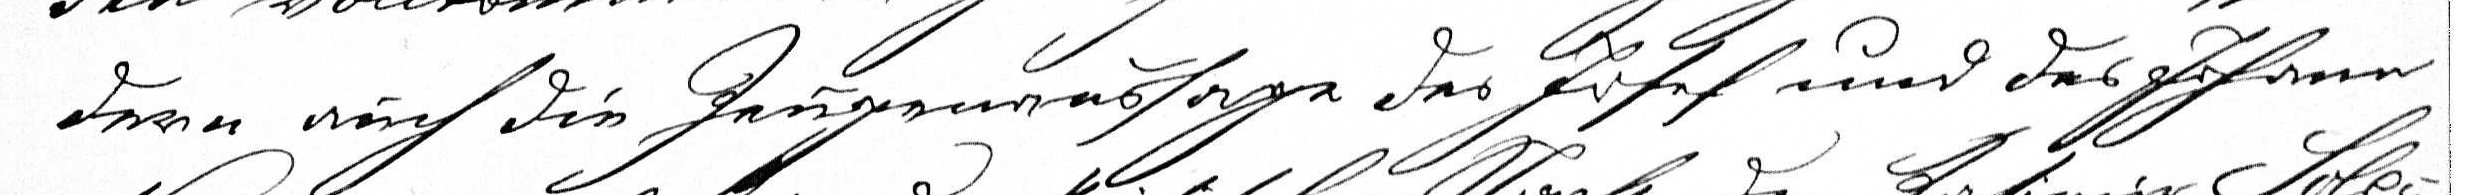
dern auch die Zeugenaussage des Josef und des Johann
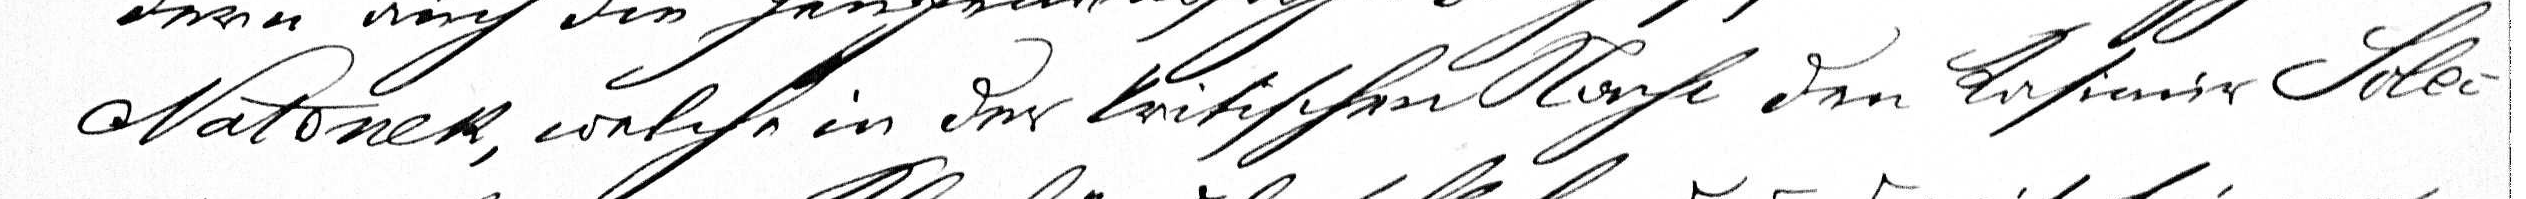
Natonek, welche in der kritischen Nacht den Kasimir Solec¬
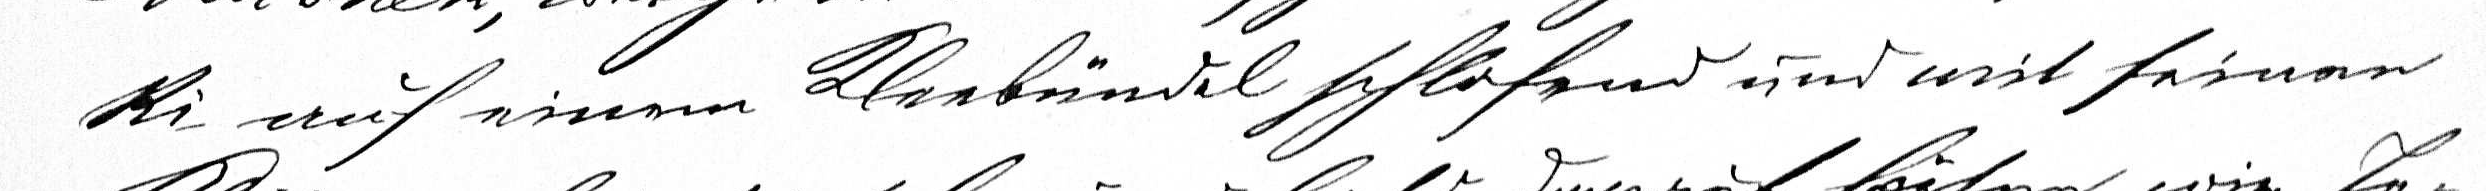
ki auf einem Kleebündel schlafend und mit seinen
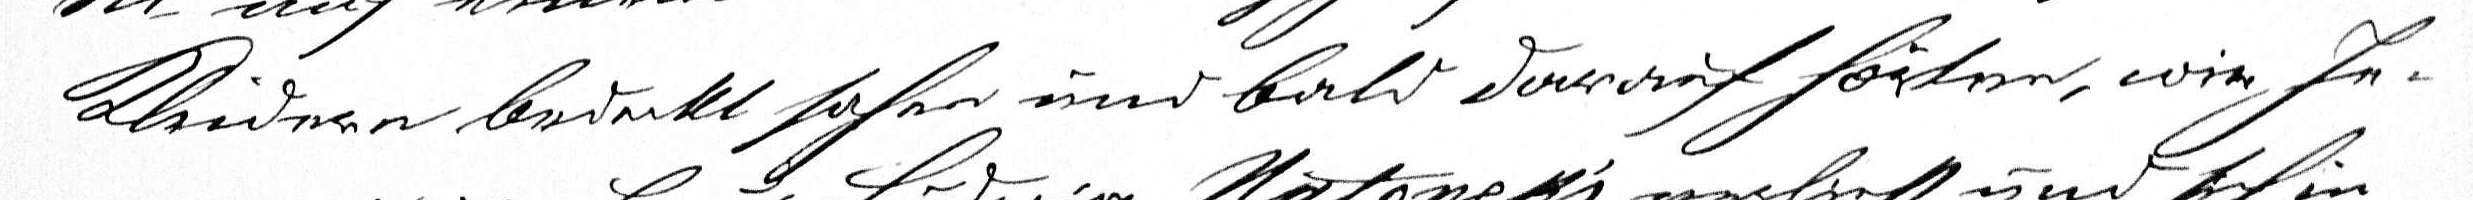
Kleidern bedeckt sahen und bald darauf hörten, wie Je¬
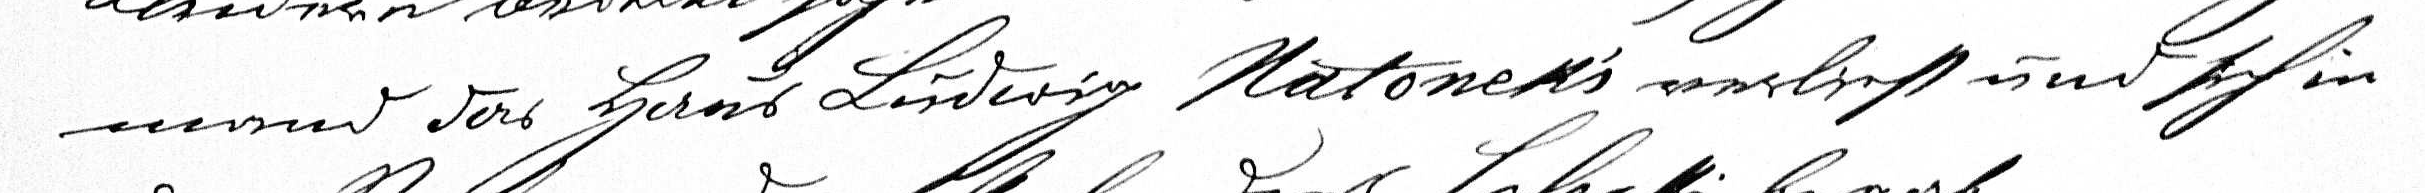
mand das Haus Ludwig Natonek’s verließ und sich in
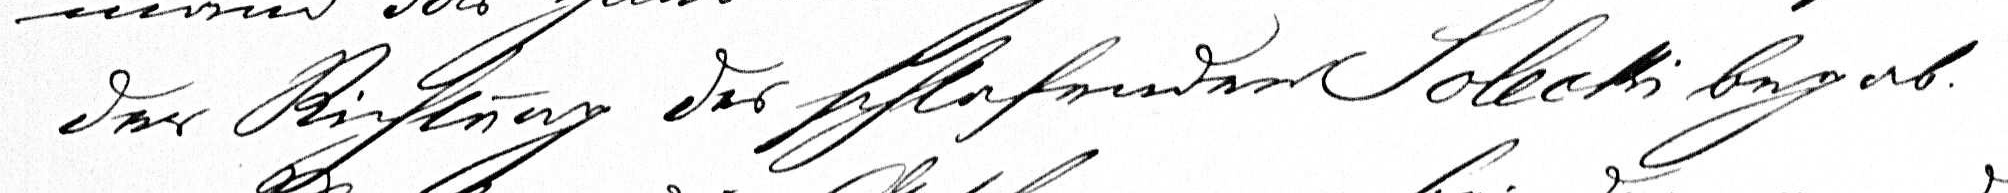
der Richtung des schlafenden Solecki begab.
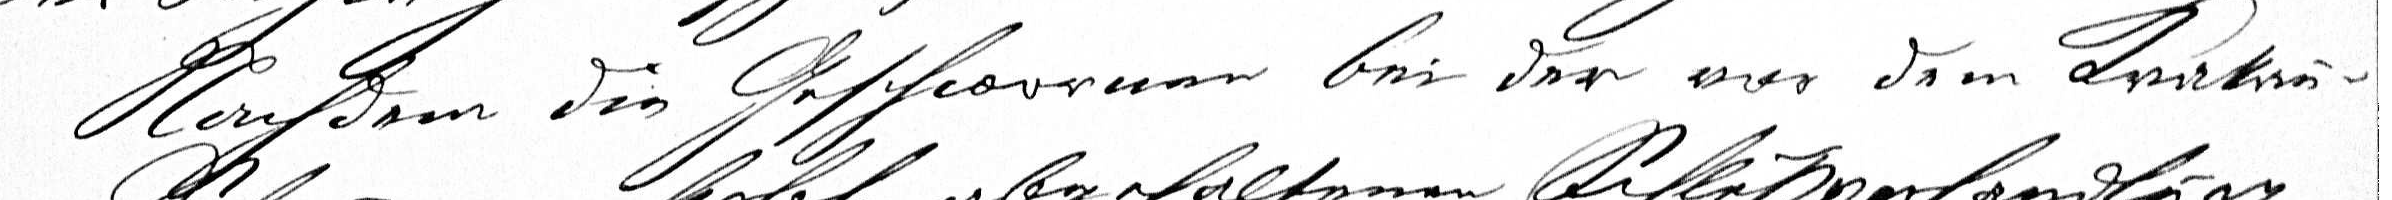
Nachdem die Geschworenen bei der vor dem Krakau¬
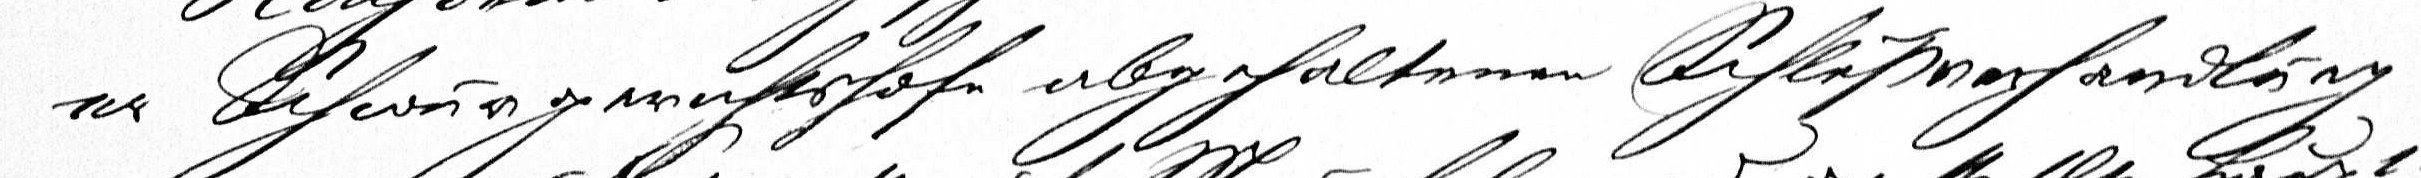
er Schwurgerichtshof abgehaltenen Schlußverhandlung
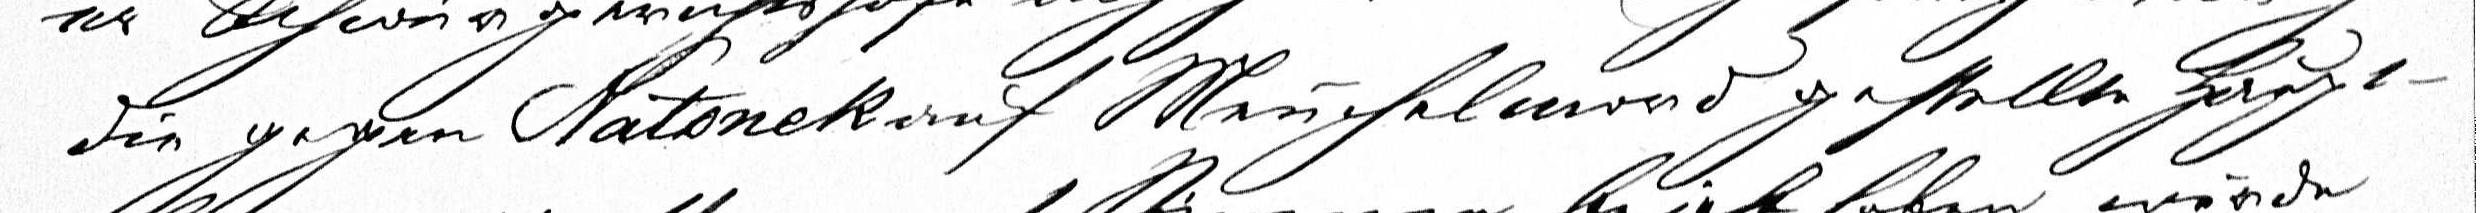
die gegen Natonek auf Meuchelmord gestellte Haupt¬
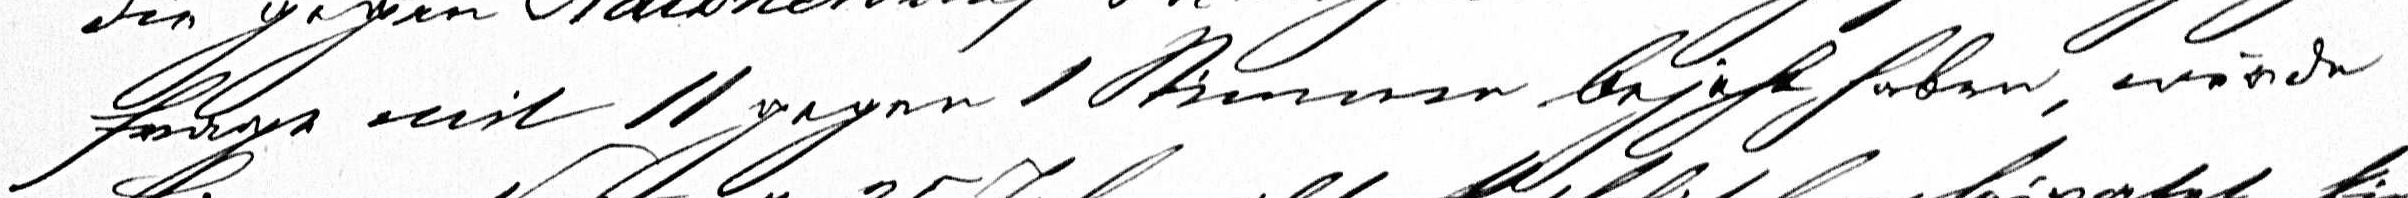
frage mit 11 gegen 1 Stimmen gejaht haben, wurde
